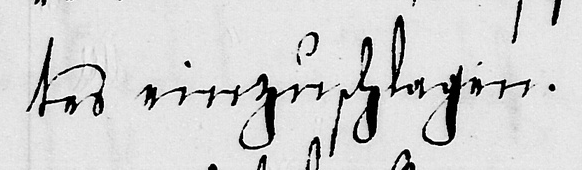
htes einzuschlagen.
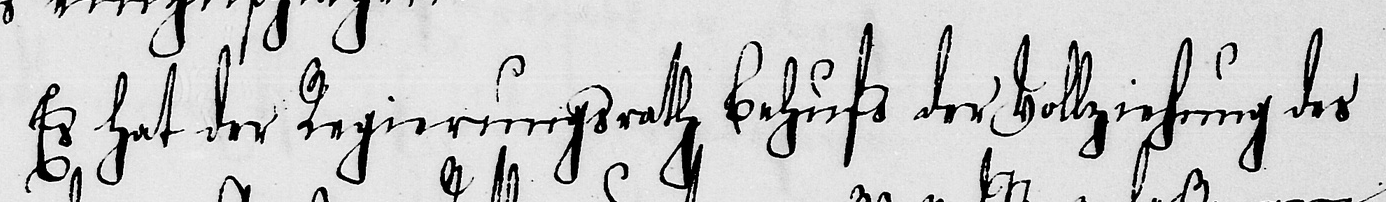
Es hat der Regierungsrath Behufs der Vollziehung des
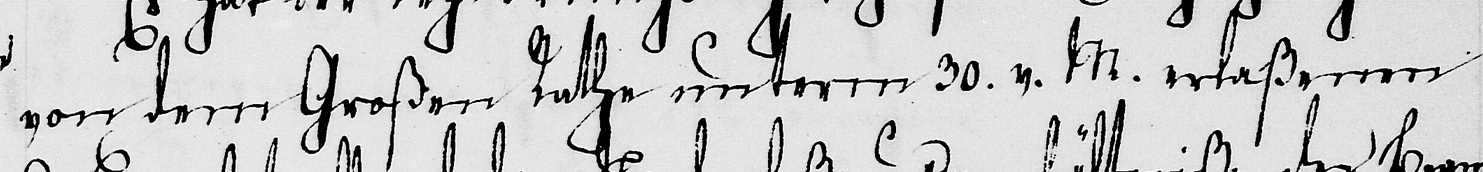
von dem Großen Rathe unterm 30. v. M. erlaßenen
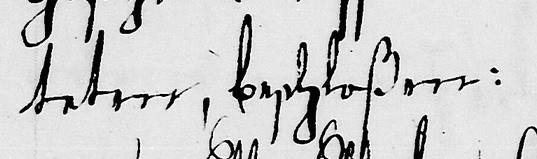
teten, beschloßen:
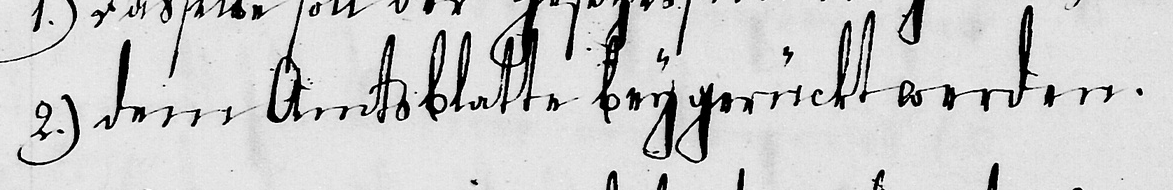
2.) dem Amtsblatte beygerückt werden.
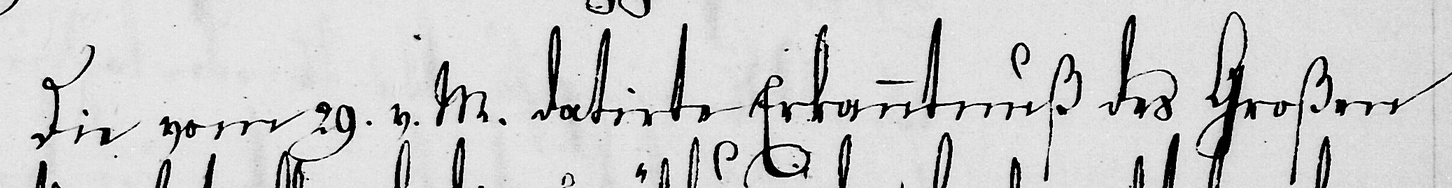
Die vom 29. v. M. datirte Erkanntnuß des Großen
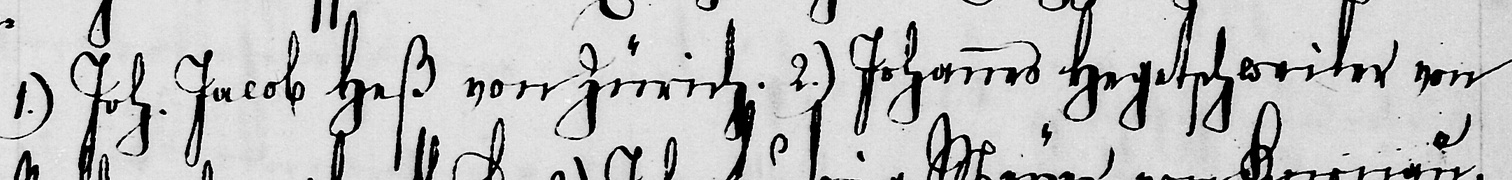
1.) Joh. Jacob Heß von Zürich. 2.) Johannes Hegetschweiler von
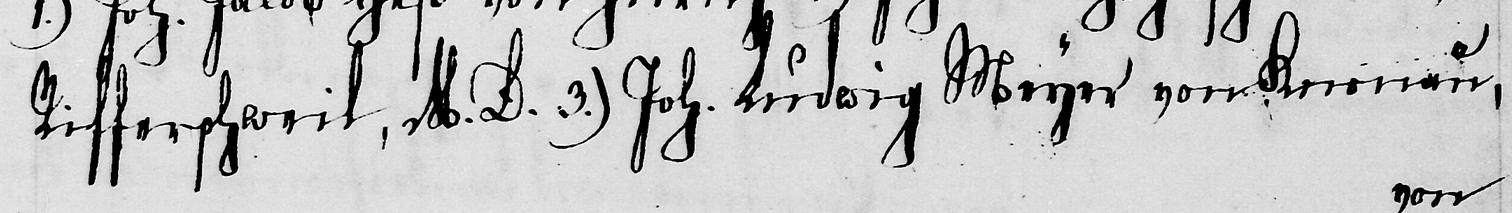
Rifferschweil, M. D. 3.) Joh. Ludwig Meyer von Knonau,
